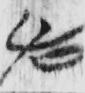左
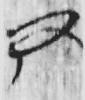尹
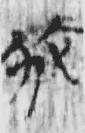{力它}
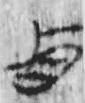貞
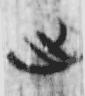出
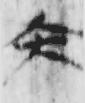內（入）
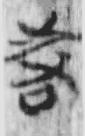○（侍）
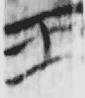王
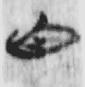自
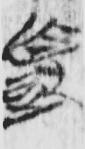○（夏）
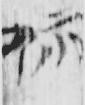𫵖
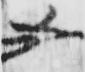之
